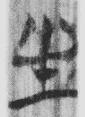生
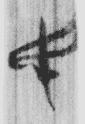民
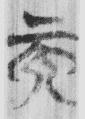而
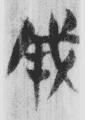成
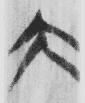大
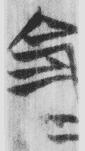命=
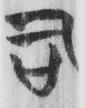司
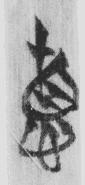惪
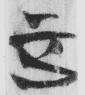正
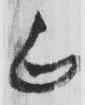㠯（以）
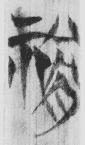禍
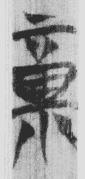福
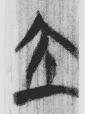立
